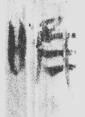唯
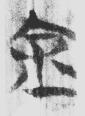余
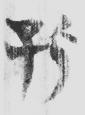孤
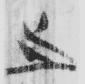之
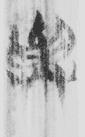與
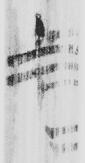上下=
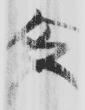交
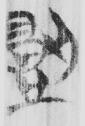剴
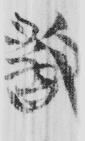敢
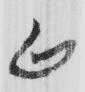㠯（以）
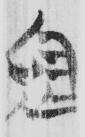衾
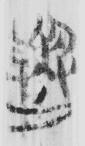𪴿
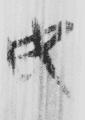女
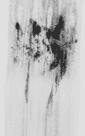幸
